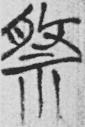祭
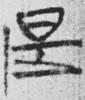是
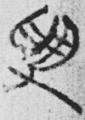受
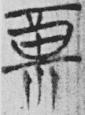福
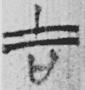吉
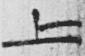上
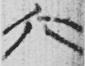六
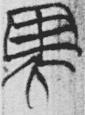需
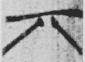亓（其）
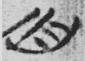首
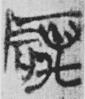礪
